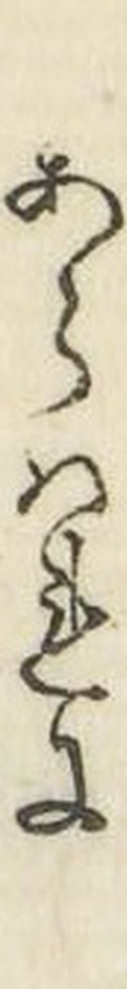あらはれに
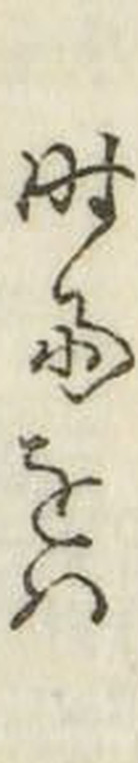時雨をは
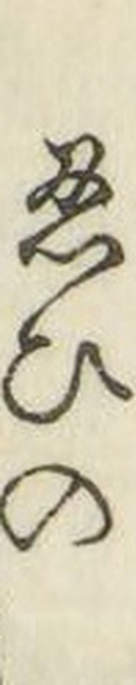忍ひの
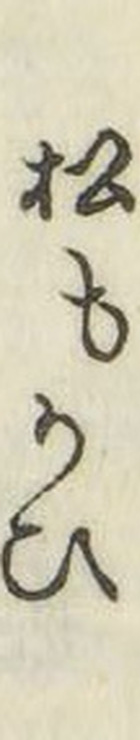松もかひ
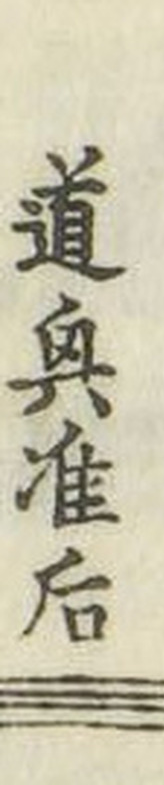道興准后

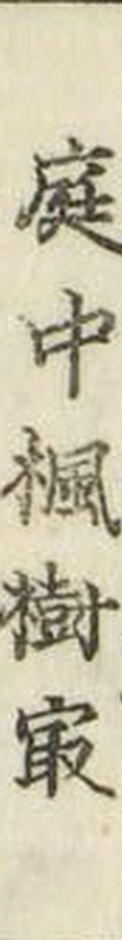庭中楓樹㝡
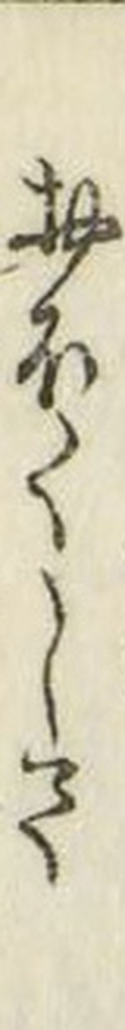おほくして
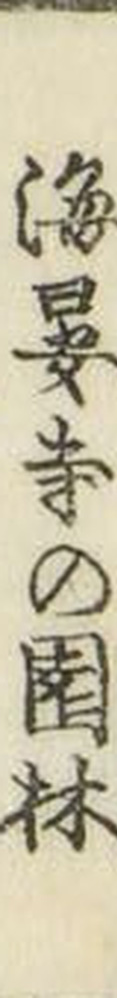海晏寺の園林
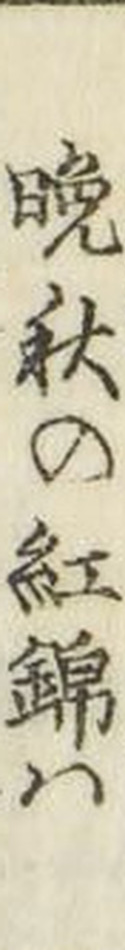晩秋の紅錦は
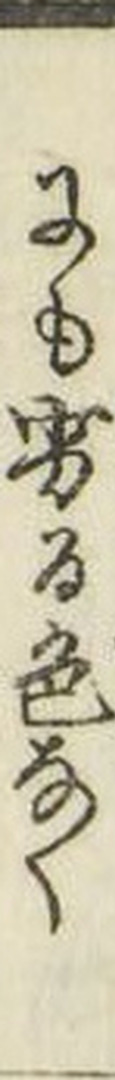にも劣る色なく
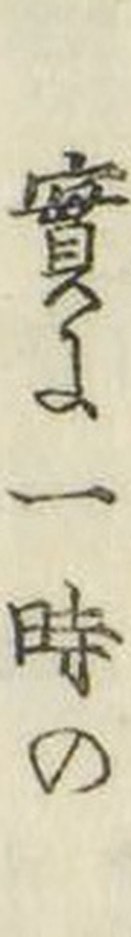実に一時の

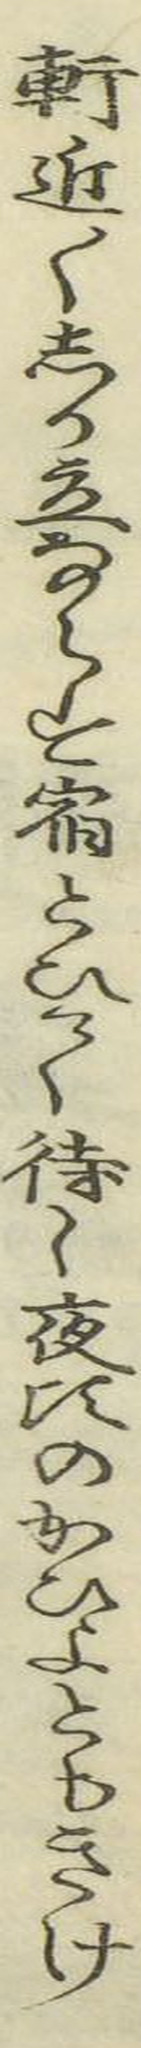軒近くしか立ならす宿とひて待し夜頃のかひよともきけ
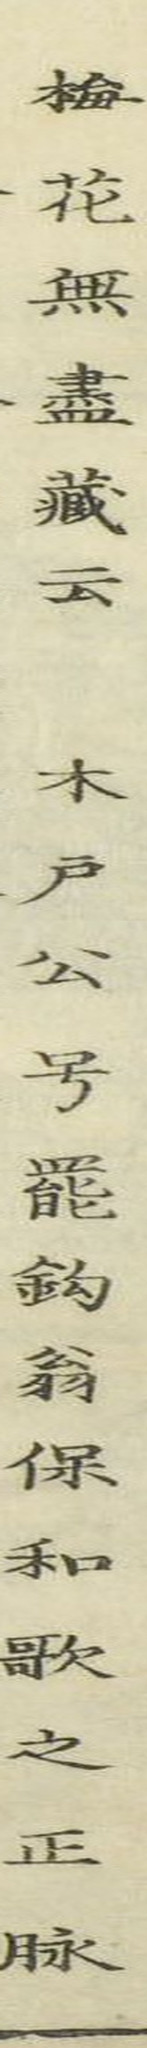梅花無尽蔵云木戸公号罷鈎翁保和歌之正脈
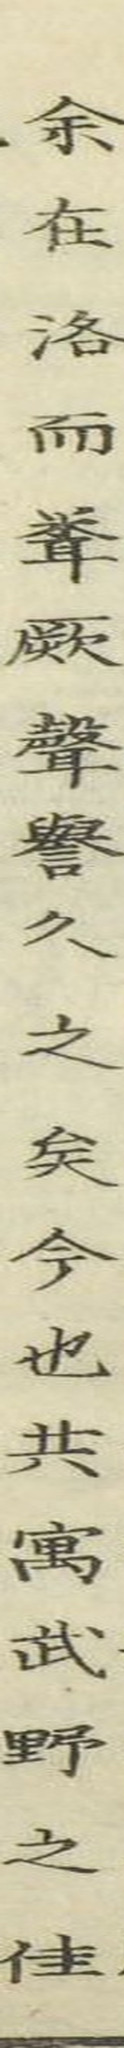余在洛而𥹢厥声誉久之矣今也共寓武野之佳
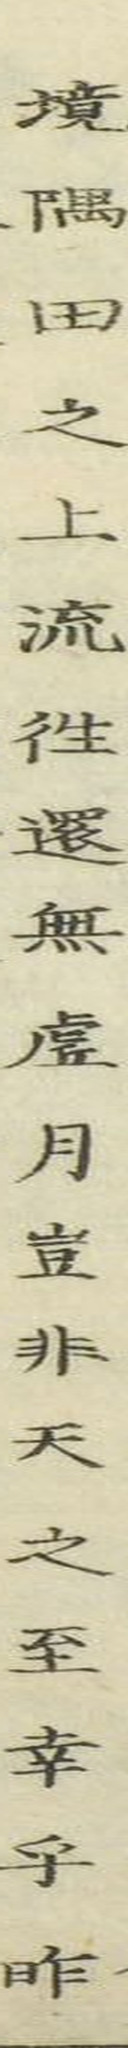境隅田之上流往還無虗月豈非天之至幸乎昨
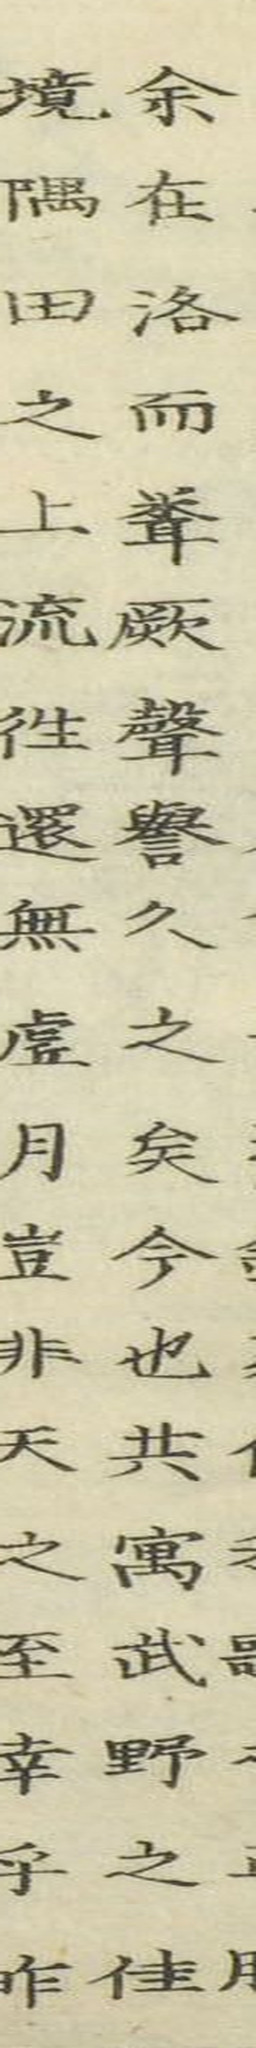境隅田之上流往還無虗月豈非天之至幸乎昨
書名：江戸名所図会 20巻 巻之17
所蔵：東京学芸大学教育コンテンツアーカイブ
